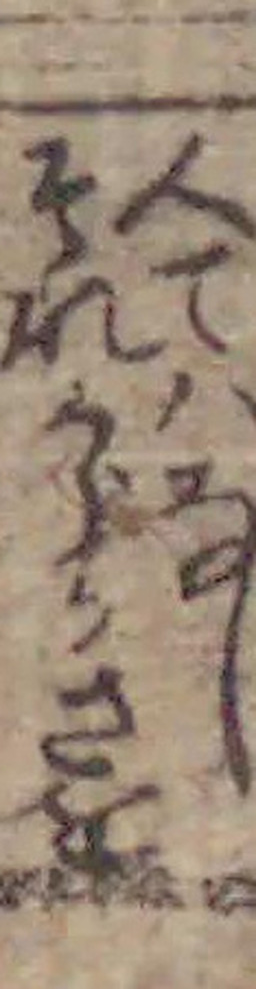それからかさを
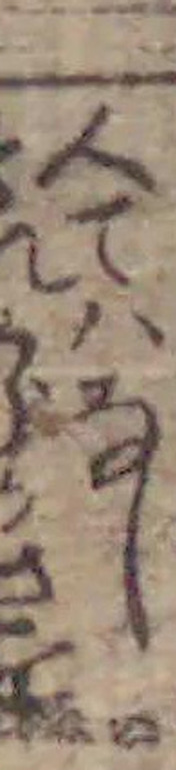人てはなし
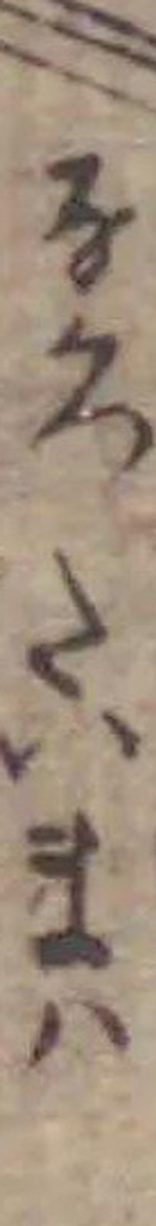なかつたいまは
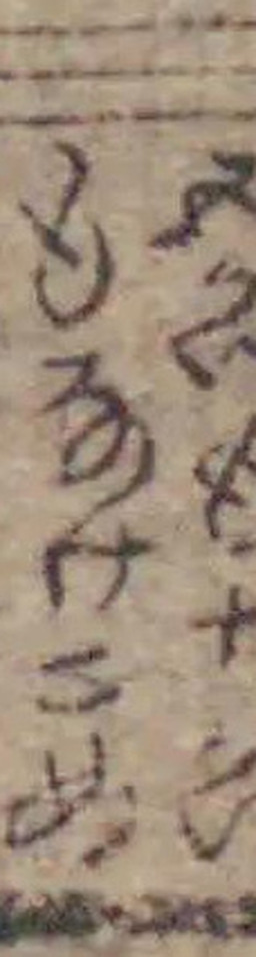もなけこめ
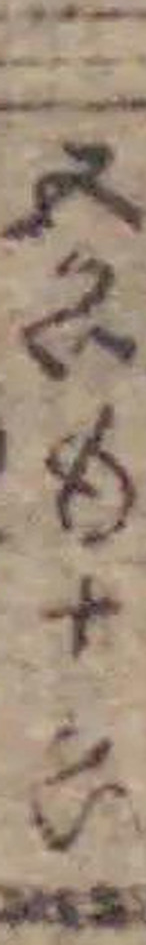五かいも十かい
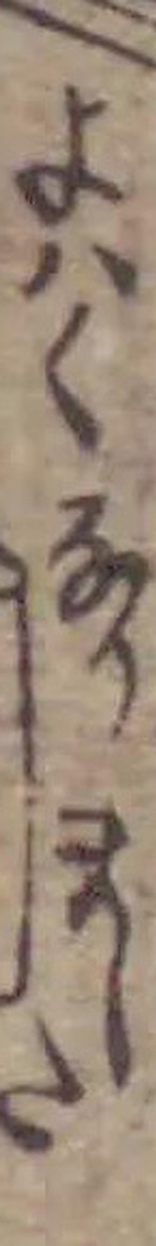よはくなりました
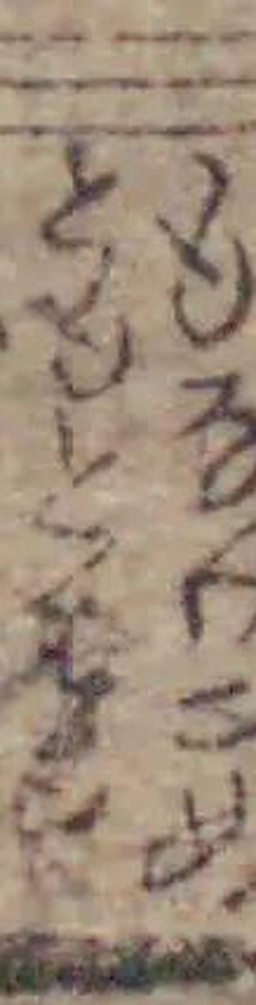ともとはす
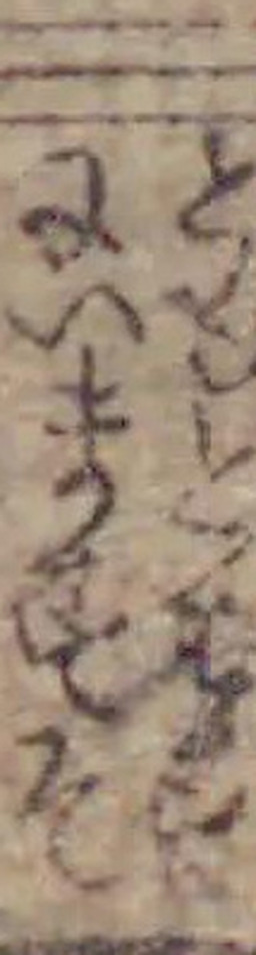にいますそ
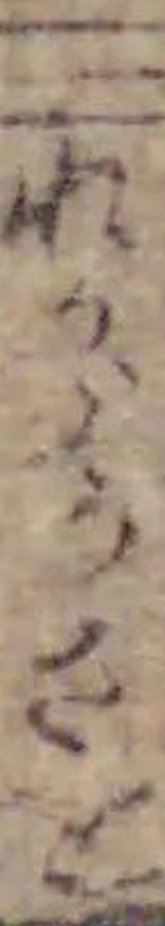れからかさを
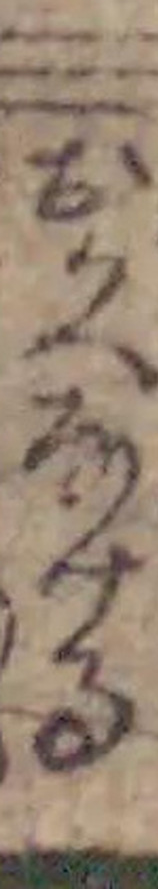おかへなける
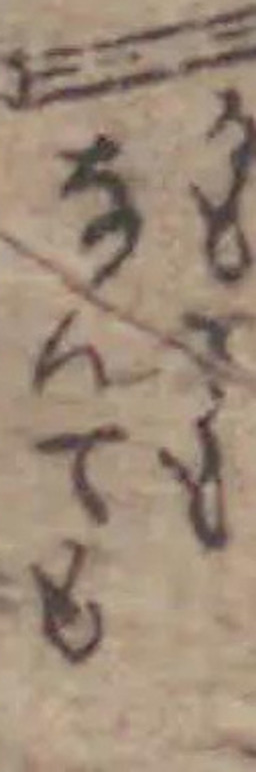なんとも
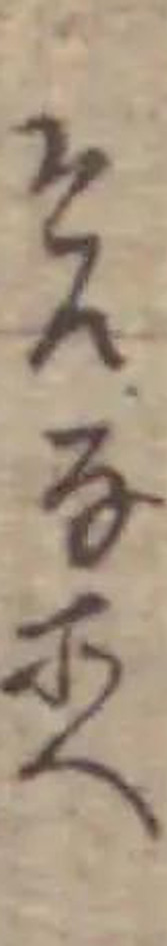そんな所へ
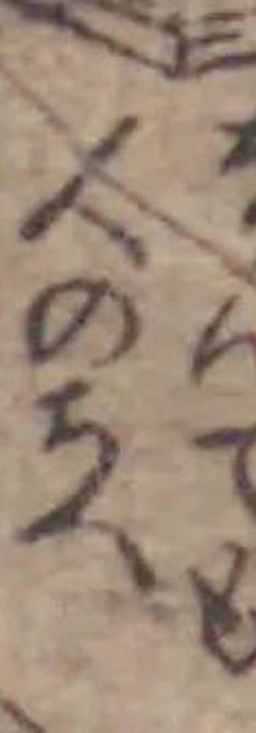人のちへ
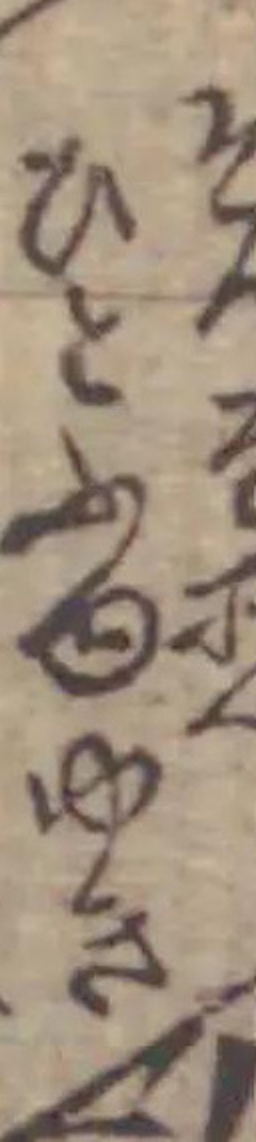ひとふゆゆき
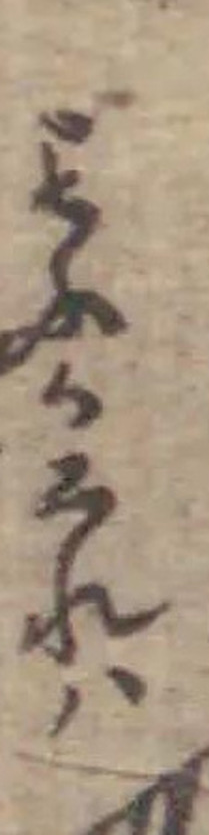ふかこれは
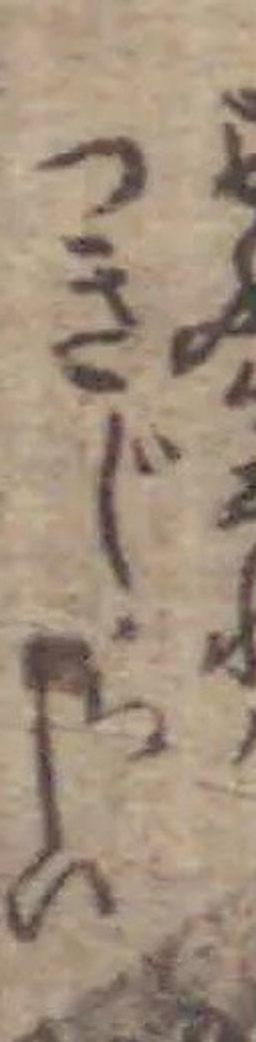つきじらしい
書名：虚言弥二郎傾城誠 3巻
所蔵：国立国会図書館 National Diet Library, JAPAN
